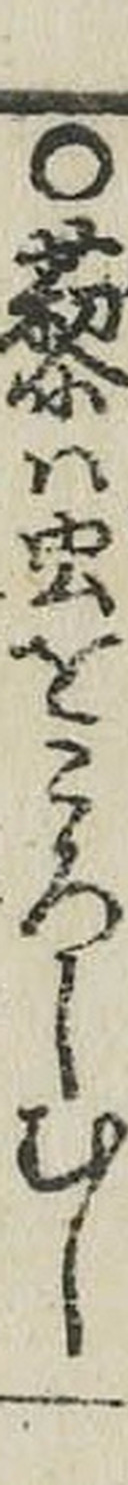○藜は虫をころしむし
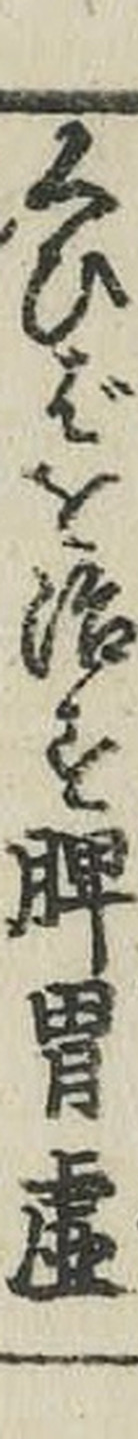くひばを治す脾胃虚
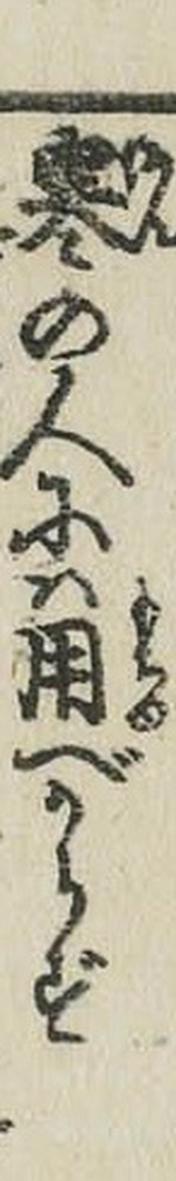寒の人には用べからず
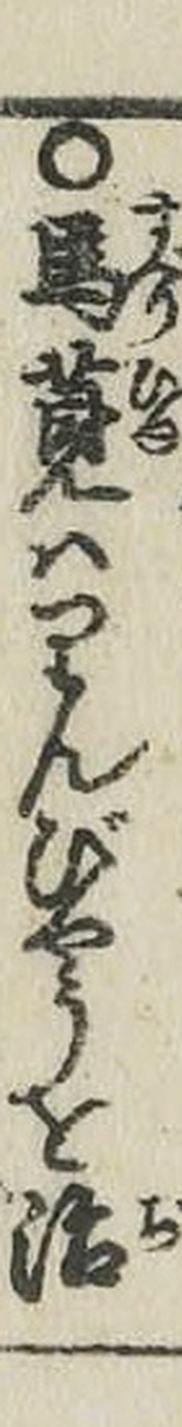○馬莧はりんびやうを治
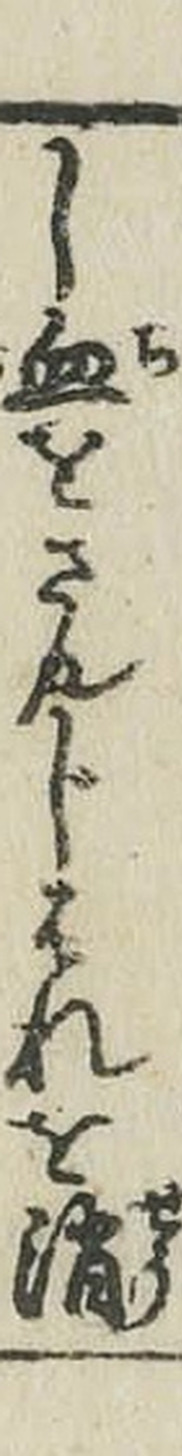し血をさんじはれを消
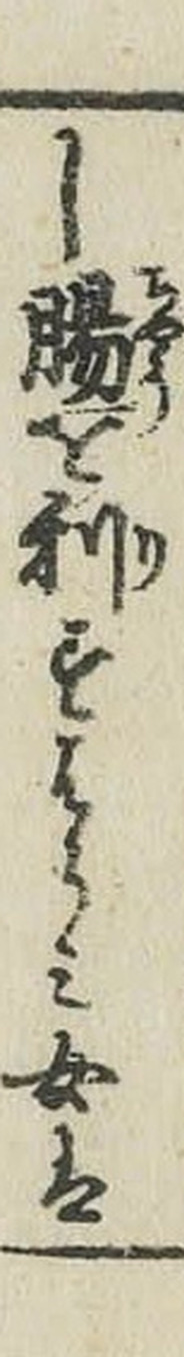し腸を利すはらみ女は
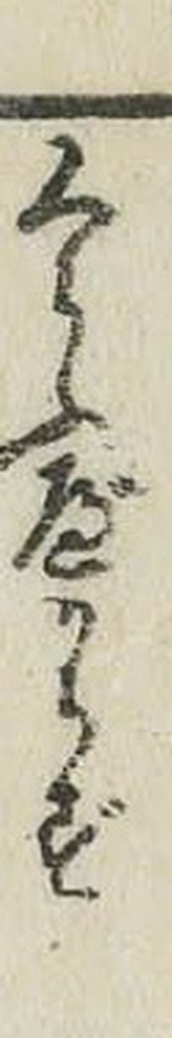くらふべからず
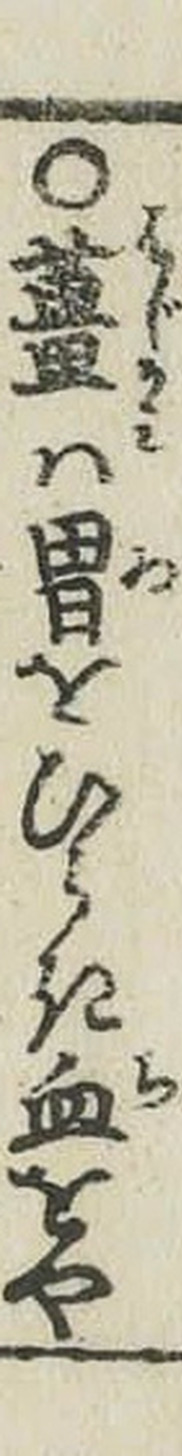○薑は胃をひらき血をや
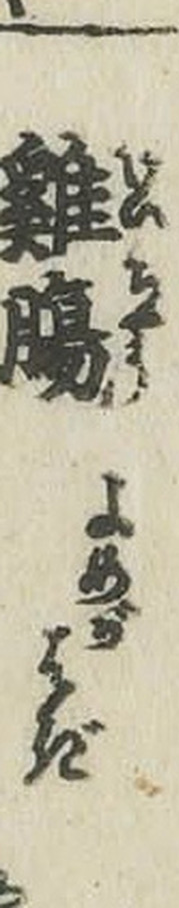鶏腸よめがはぎ
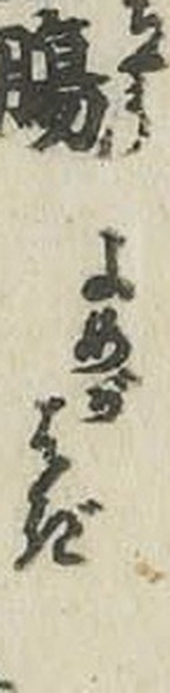鶏腸よめがはぎ
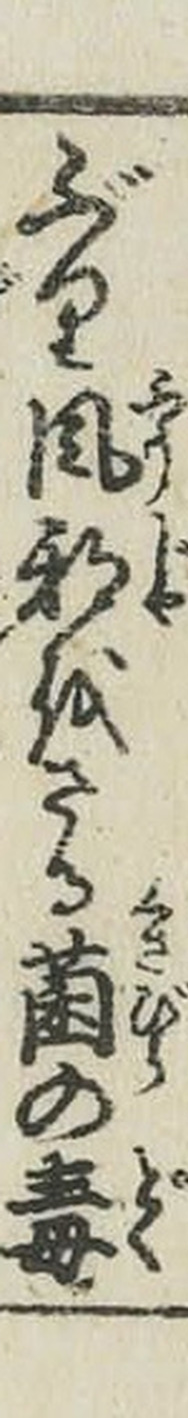ぶり風邪をさる菌の毒
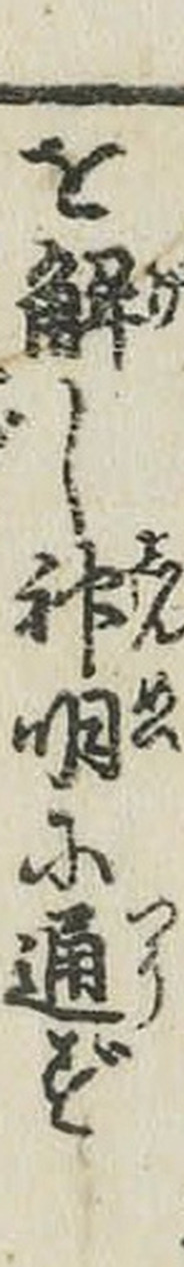を解し神明に通ず
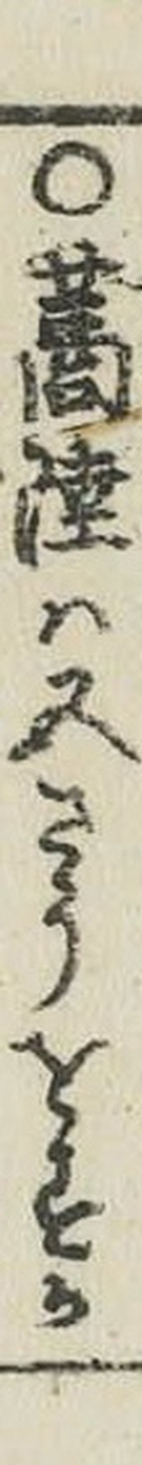○蔏陸は五さうをすか
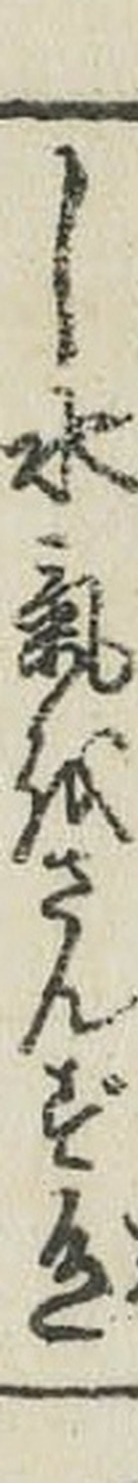し水気をさんず色
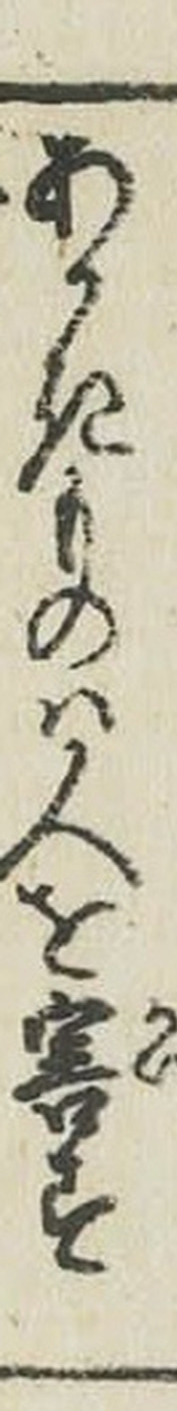あかきものは人を害す
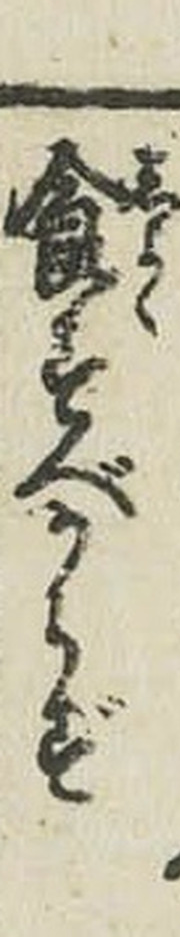食すべからず
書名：増補頭書訓蒙図彙大成 10巻 8:巻之17-19
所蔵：東京学芸大学教育コンテンツアーカイブ
